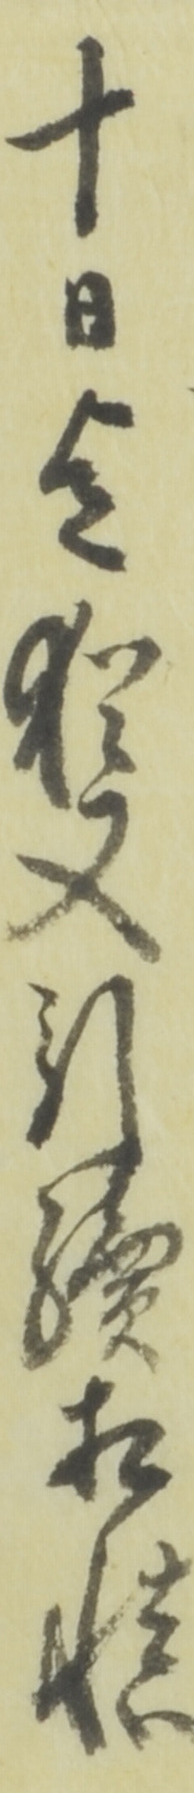十日迄猶又引続相慎
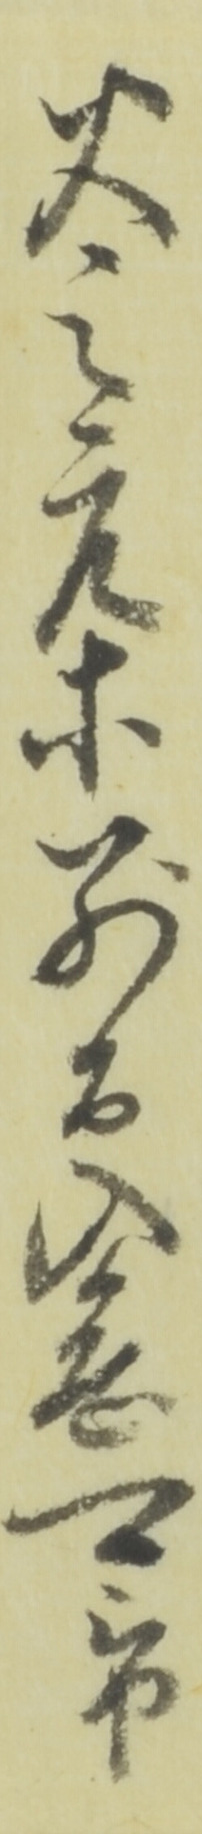火之元等別而入念被申
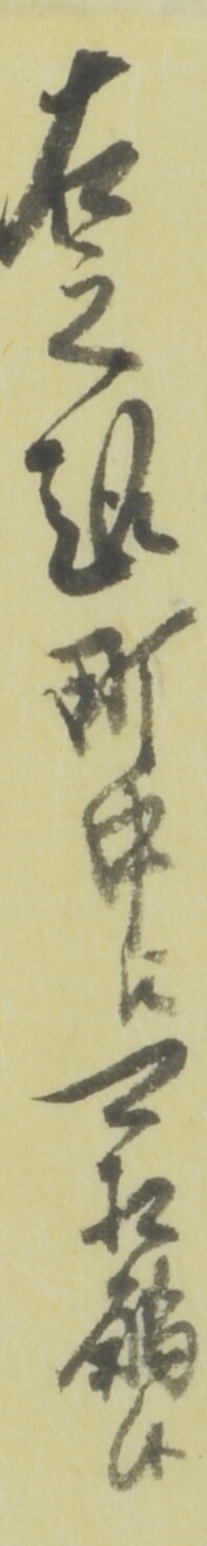右之趣町中江可相触候
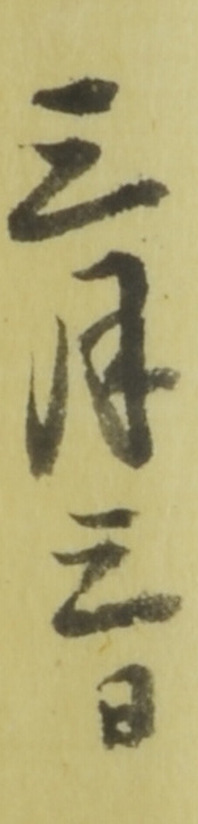三月三日
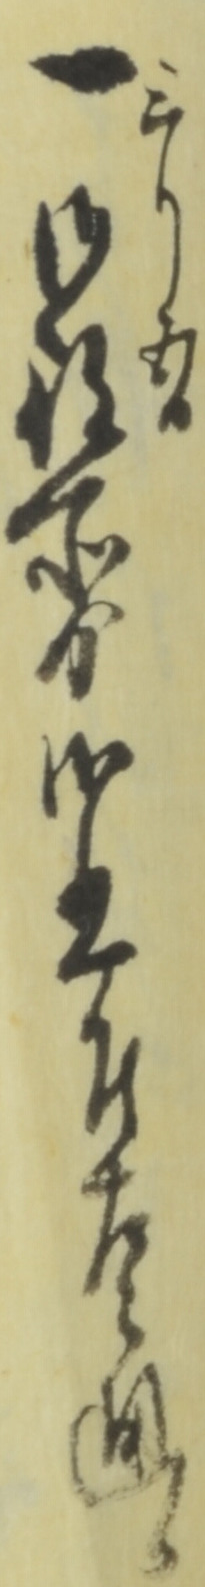一御役所ゟ御書付左之通り
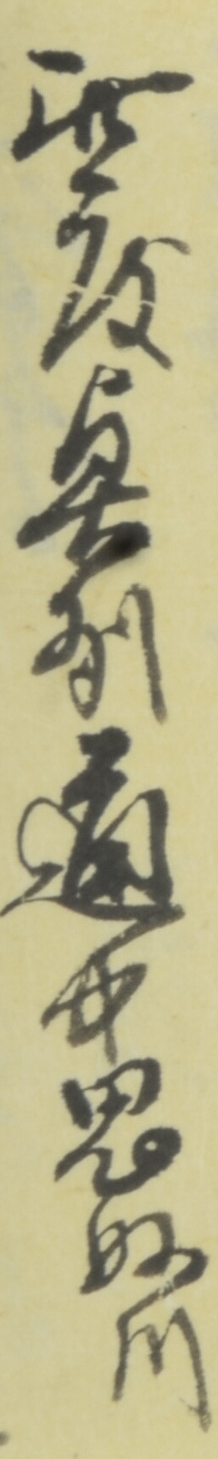此度奥州道中鬼怒川

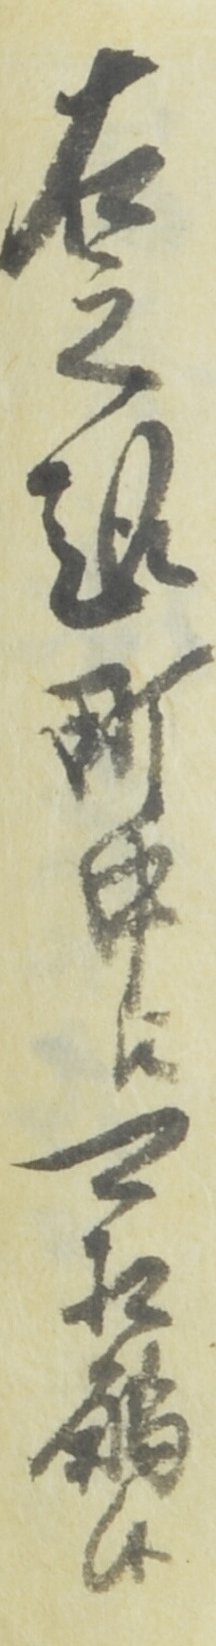右之趣町中江可相触候
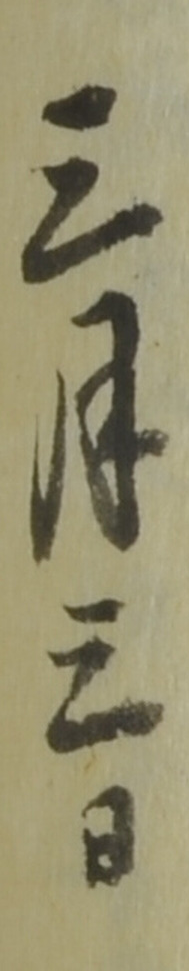三月三日
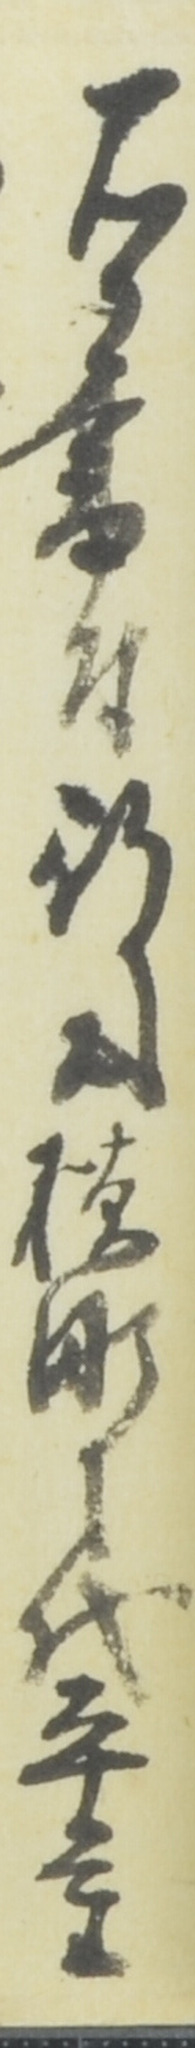右御書付行司横町丁代平重
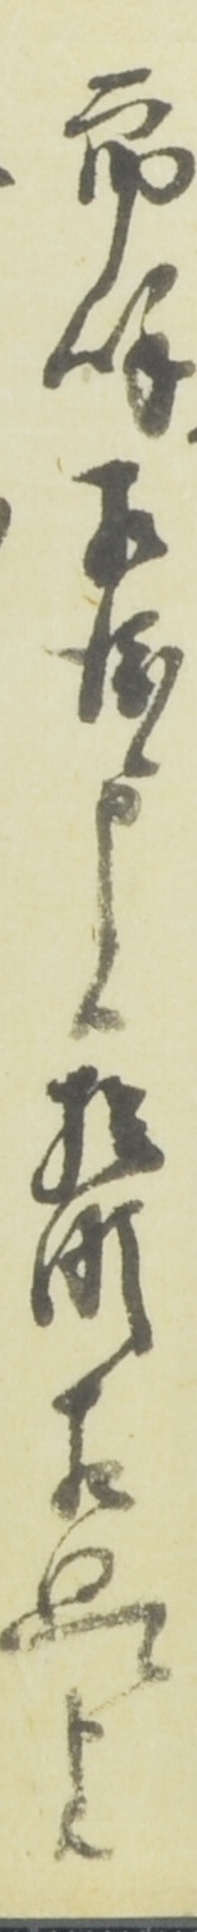郎触相渡申候拾町相廻候申候
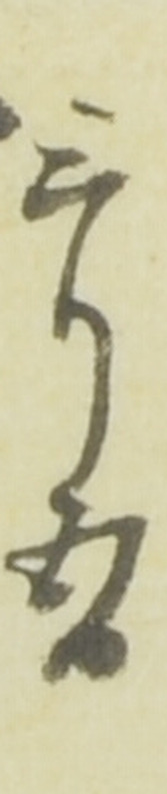三月五日
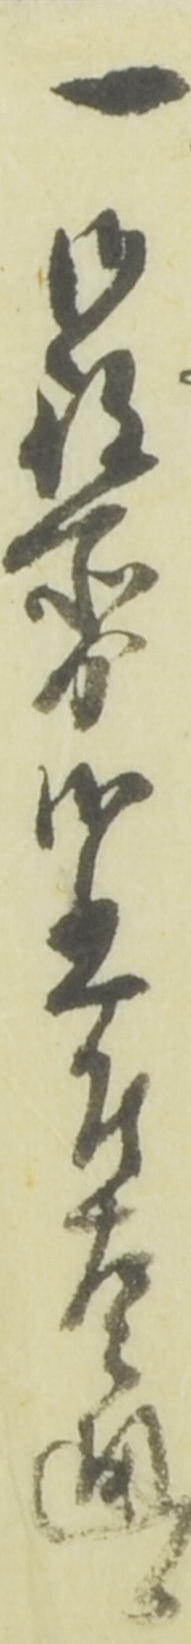一御役所ゟ御書付左之通り
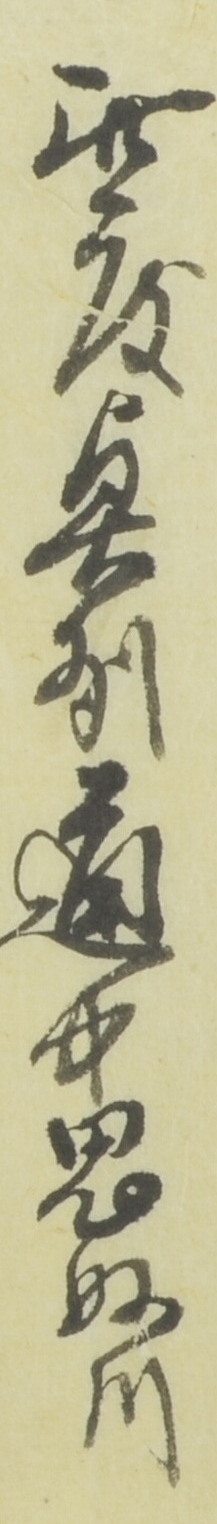此度奥州道中鬼怒川
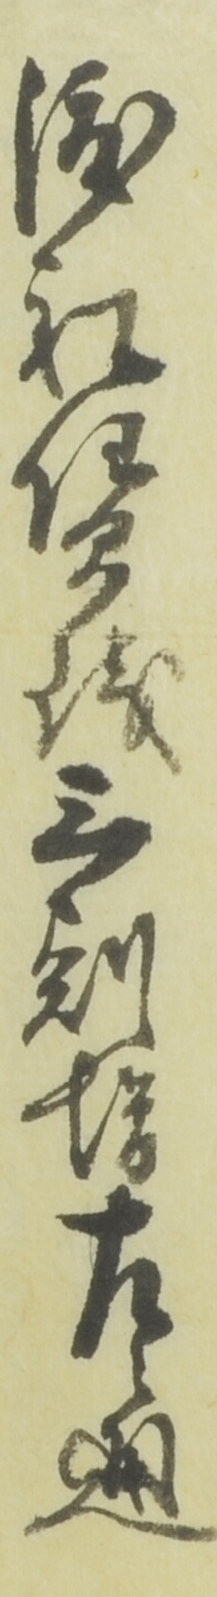渡船賃銭三割増左之通
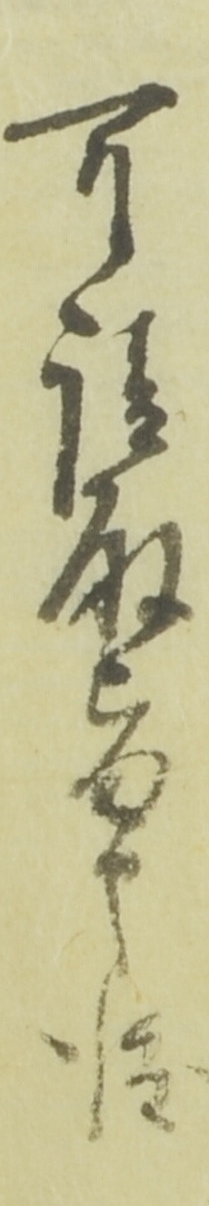可請取旨申渡
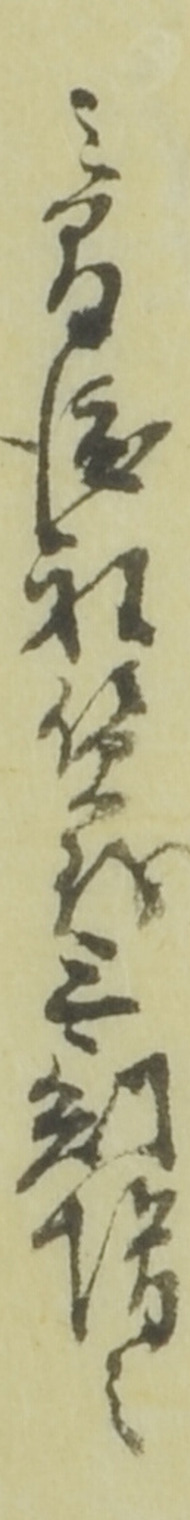之間渡船賃銭三割増之
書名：御触書御書附控
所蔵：伊那市立高遠町図書館・合同会社AMANE
